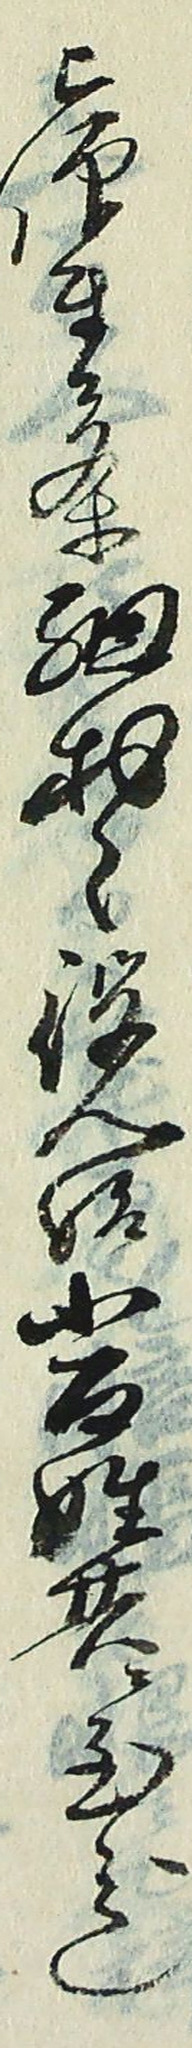被仰付候条組村々役人始小百姓ニ至迄
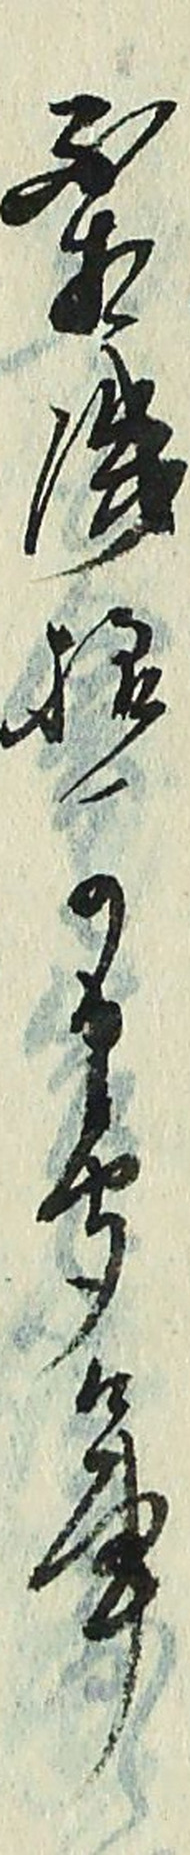不相洩様可申聞候事
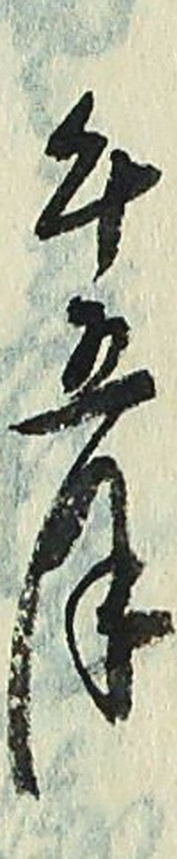午五月
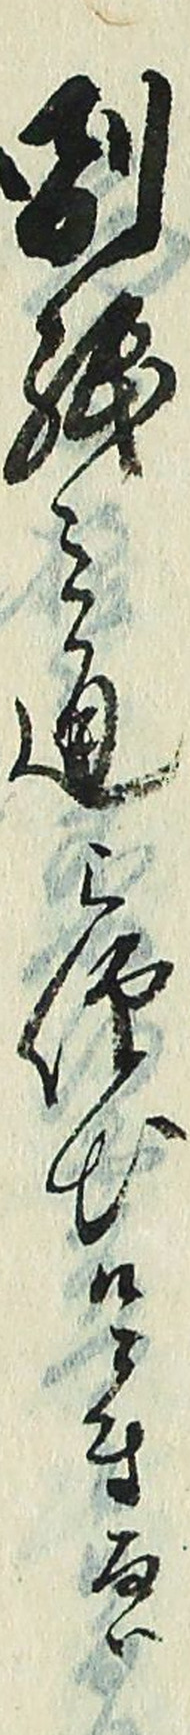別紙之通被仰出候ニ付而ハ
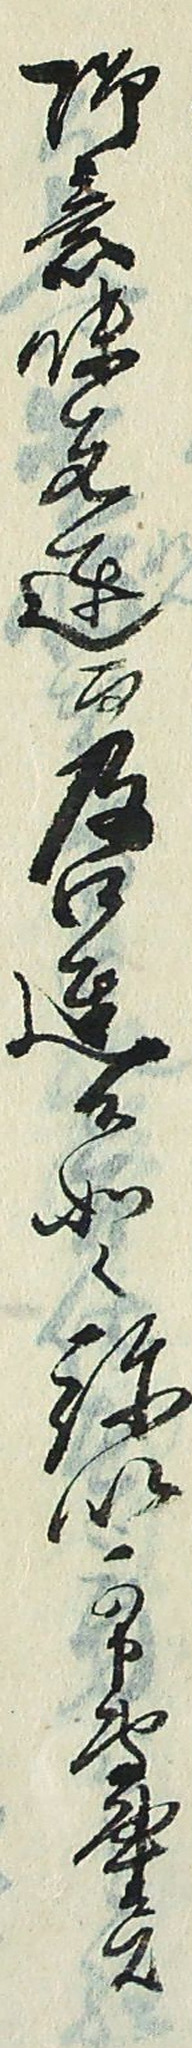御意味先達而及口達候如く弥以可申専事ニ候
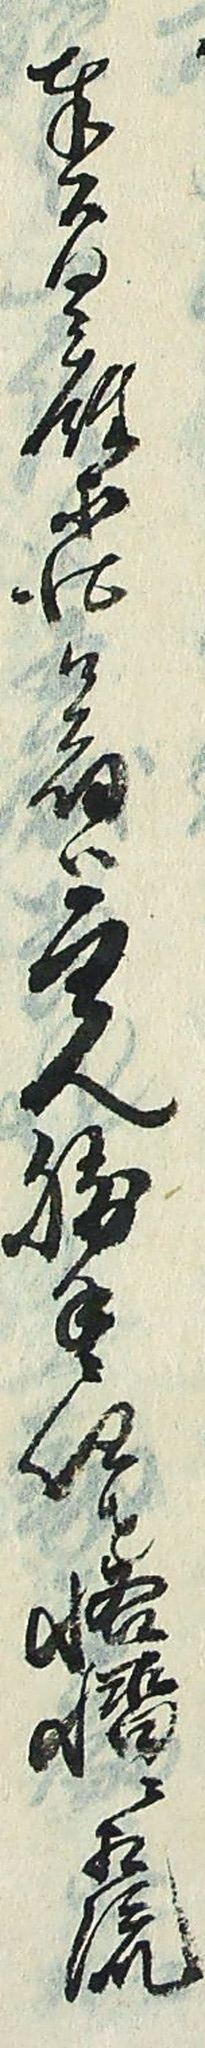奉公日雇等仕候者ハ主人勝手ニ任せ悋懎ニ相流
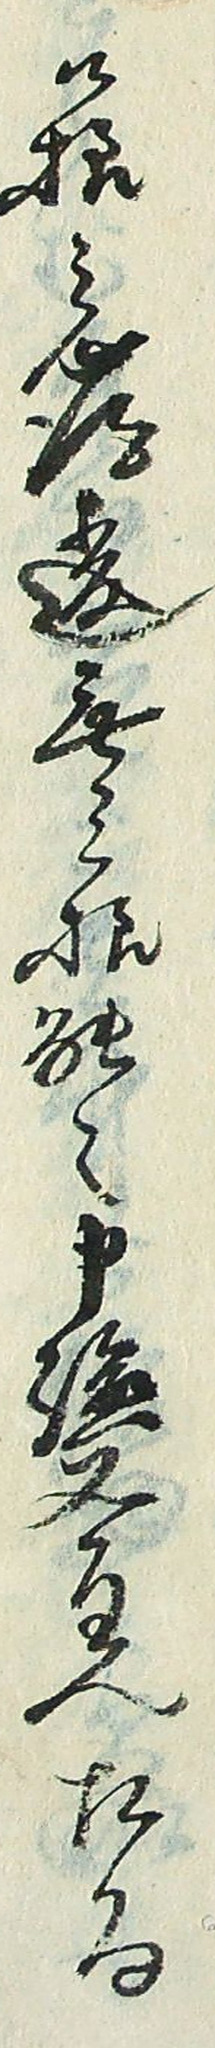候様之心得違無之様能々申諭又主人たる

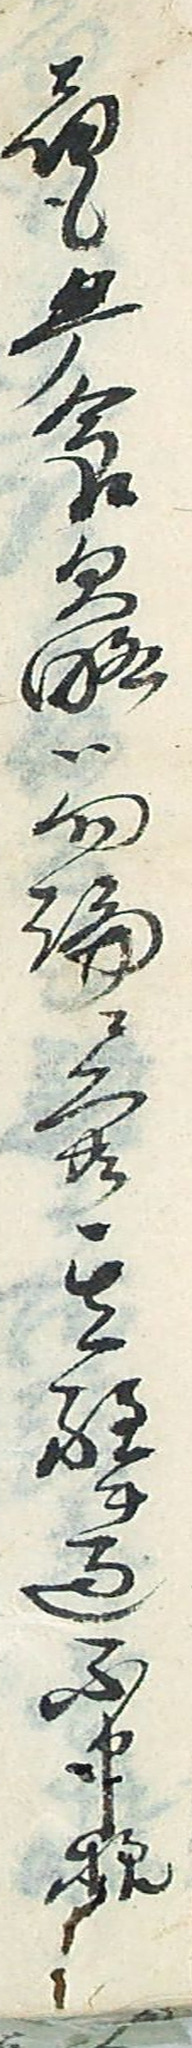者も麁食欠略ハ勿論ニ候へ共其程ヲ過不申様
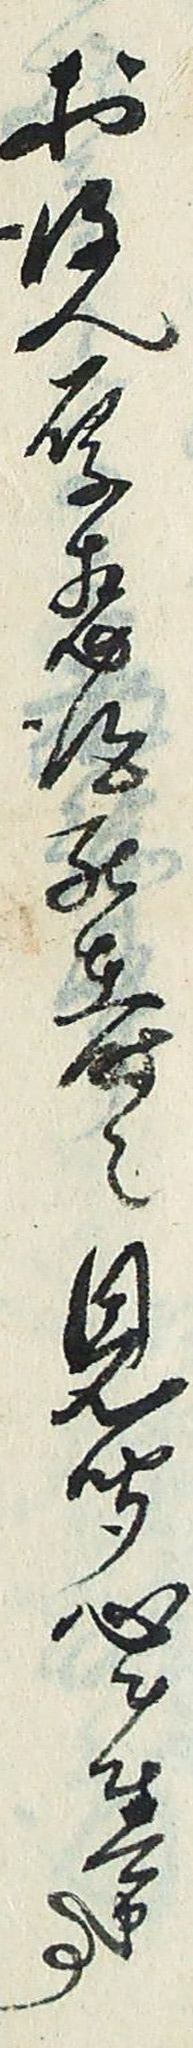村役人厚相心得罷在時々見聞心ヲ付可申事
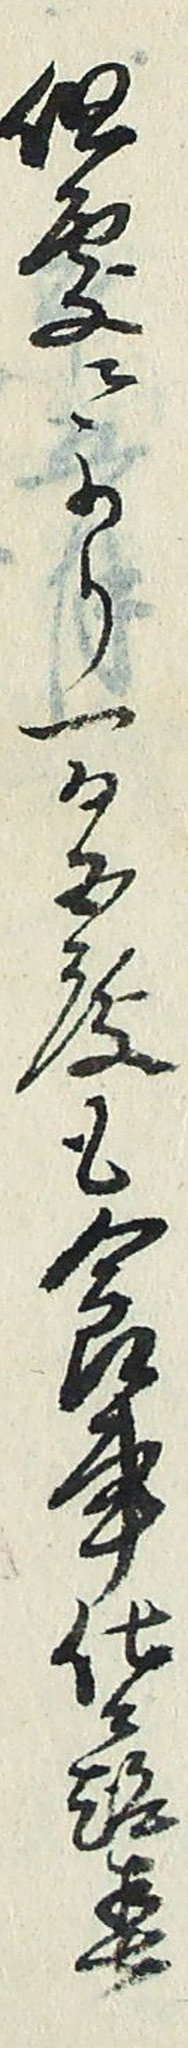但處ニより一日五度も食事仕候趣春
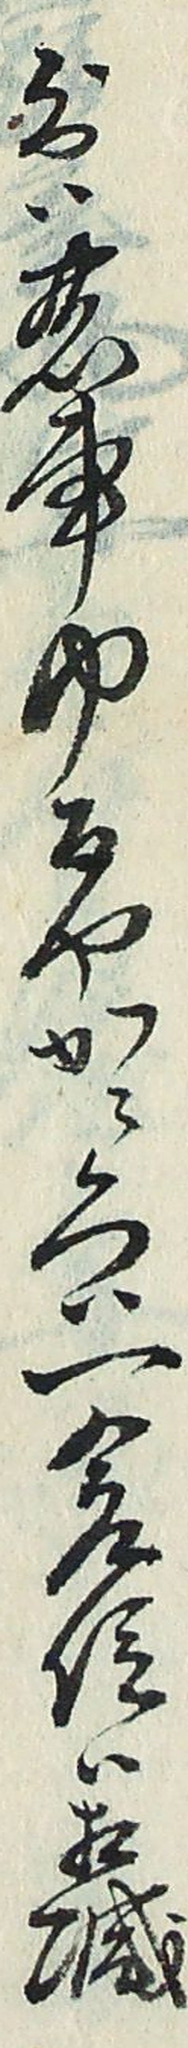分ハ農事ゆるやかニ候へハ一食位ハ相減
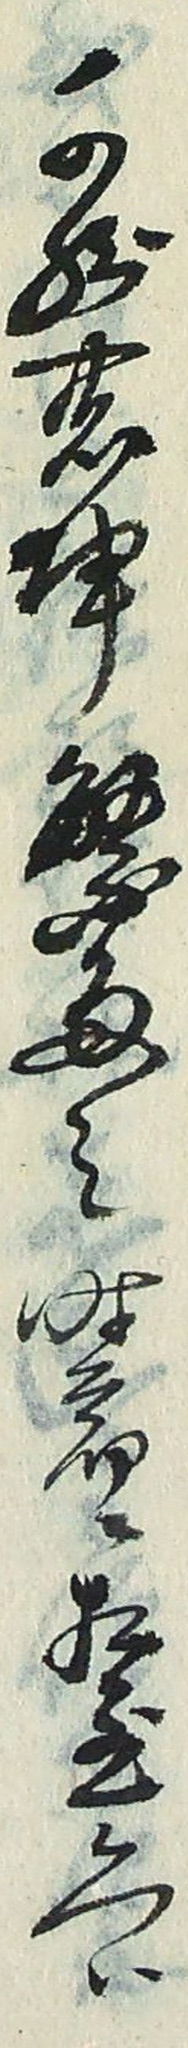可然農事繁多之時節ニ相至候へハ
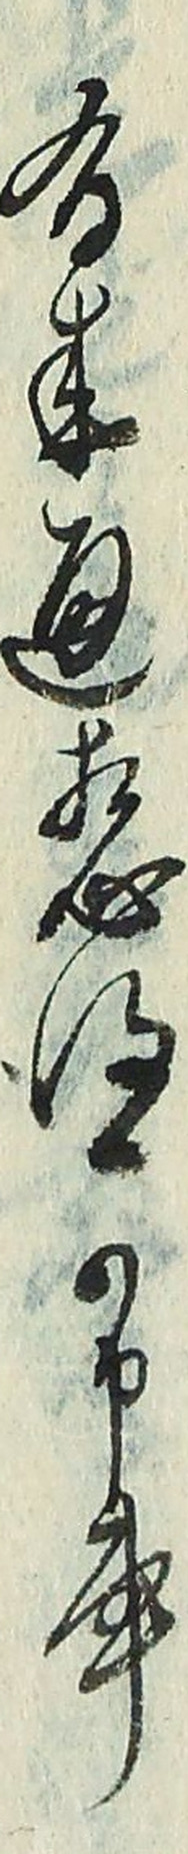有来通相心得可申事
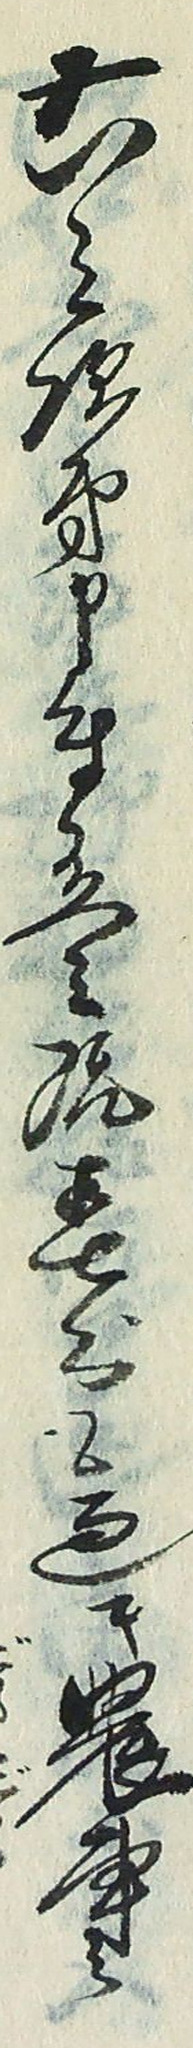右之次第申付有之既春分も過キ農事之
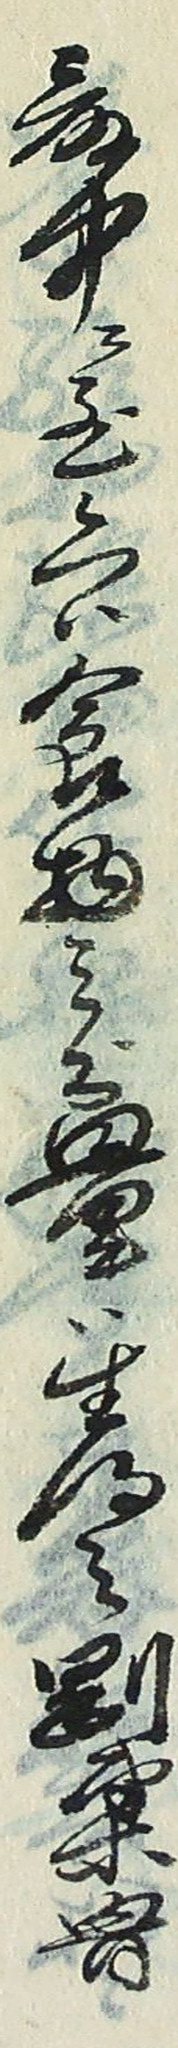最中ニ至候へハ食物之分量ハ生得之剛柔骨
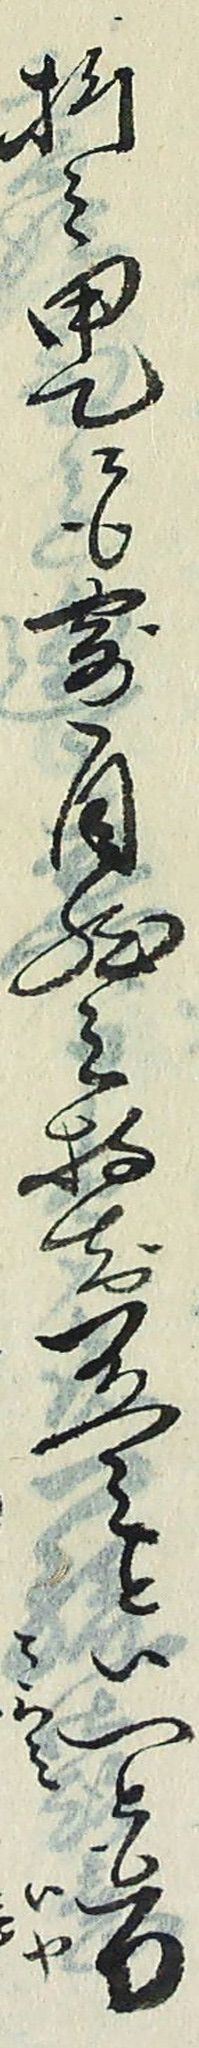折之甲乙ニも寄自然之持前有之といへとも万
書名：諸御趣意書并御下知向之写
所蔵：鳴門教育大学 Naruto University of Education
